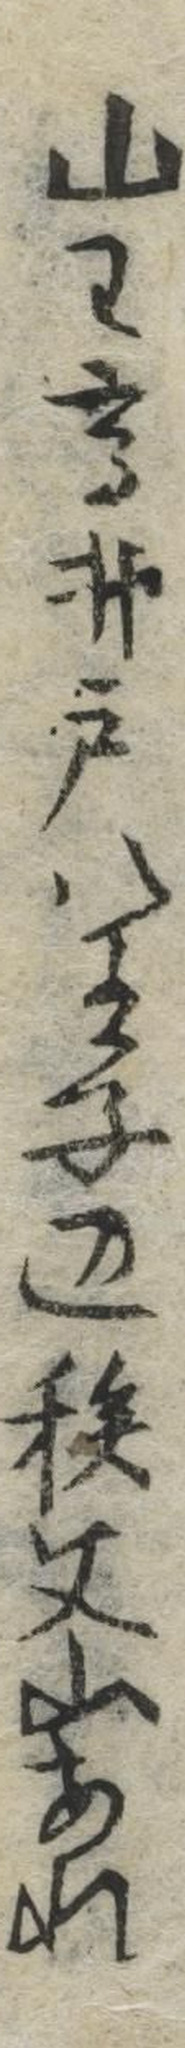山王高井戸八王子辺秩父山あれ
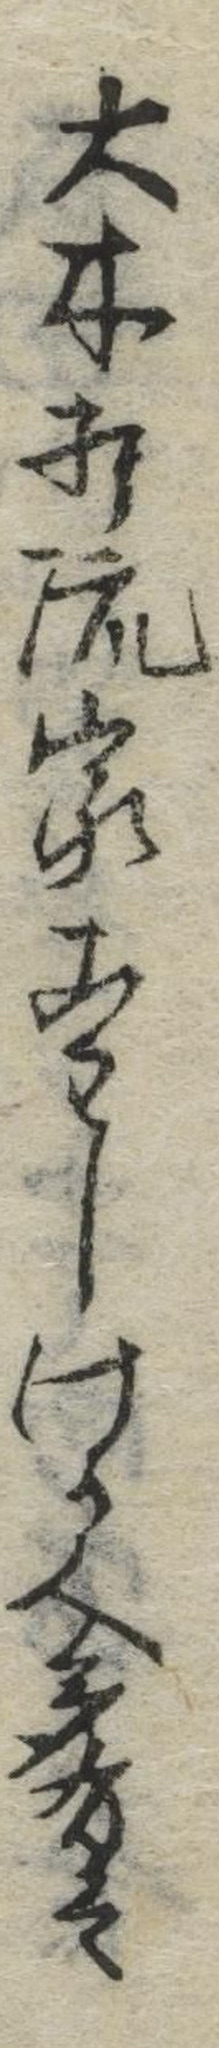大木打流家こわしけか人多有之
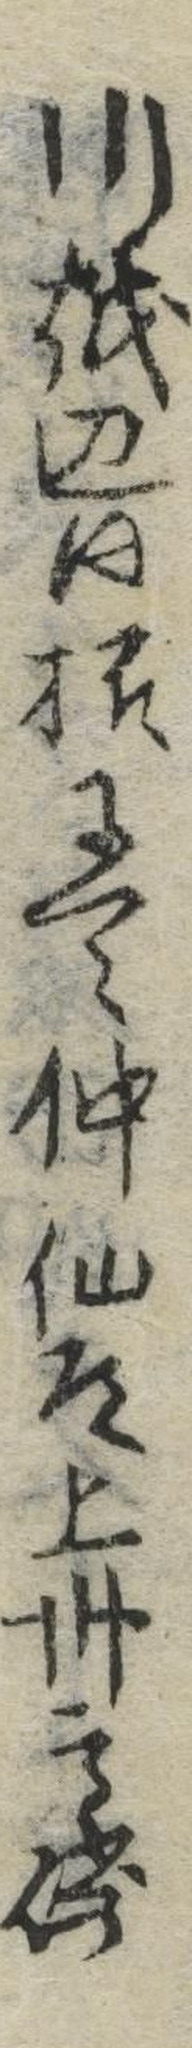川越辺同様にて仲仙道上州高崎
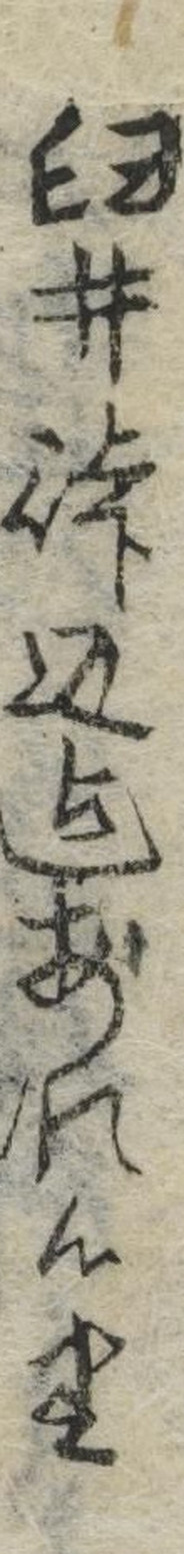臼井峠辺迄あれ候由
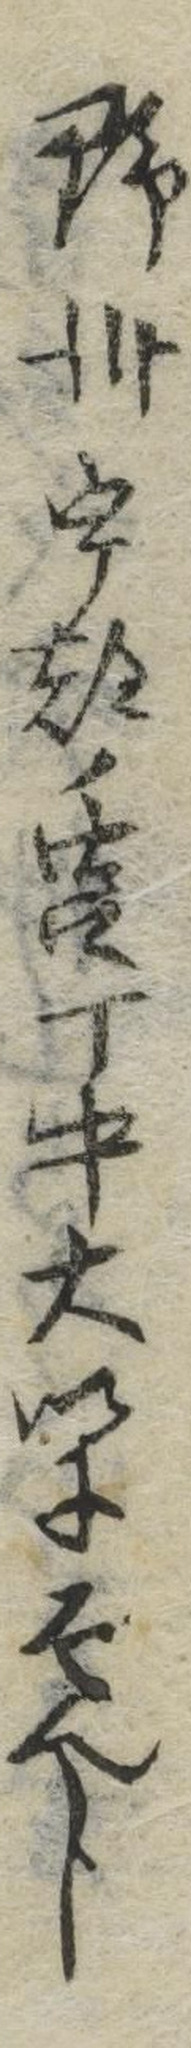野州宇都ノ宮丁中大いにそんじ
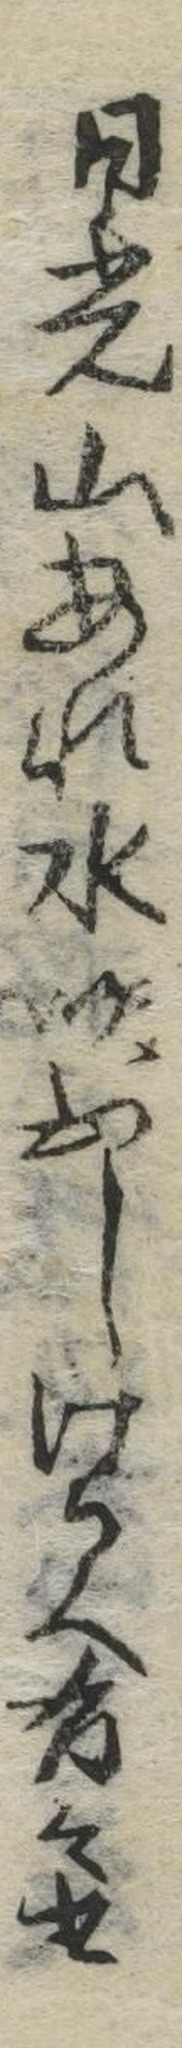日光山あれ水吹出しけか人有之由
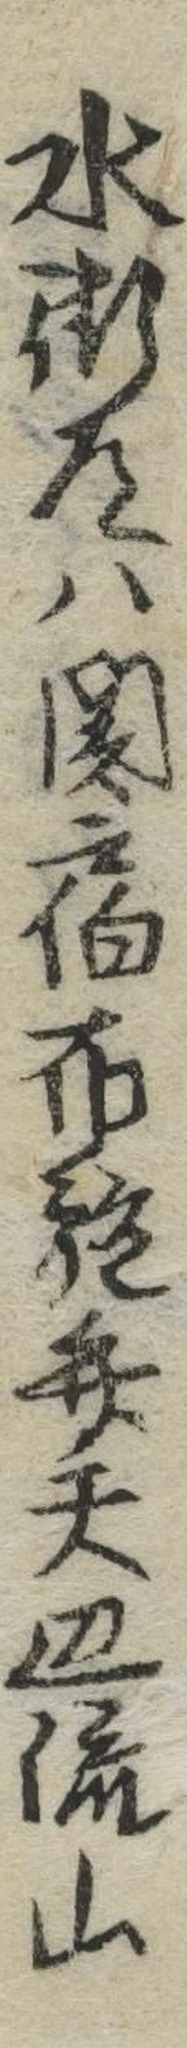水街道ハ関宿布施弁天辺流山
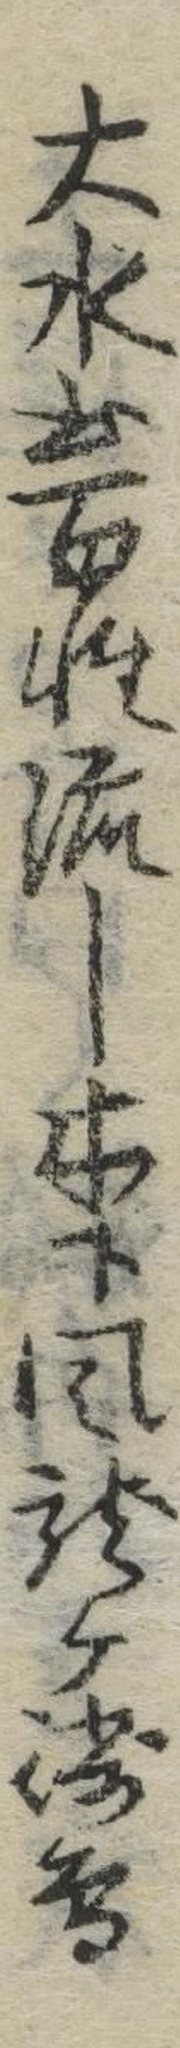大水出百性流し木下風龍ケ崎鳥
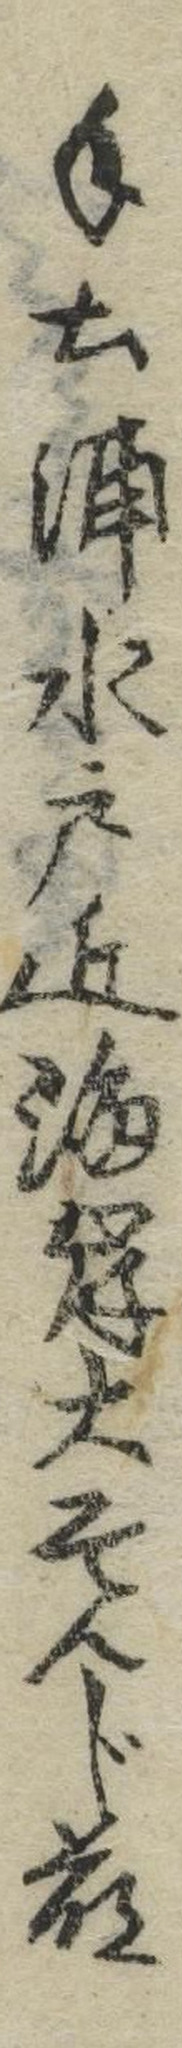手土浦水戸近海岸大そんじ崩
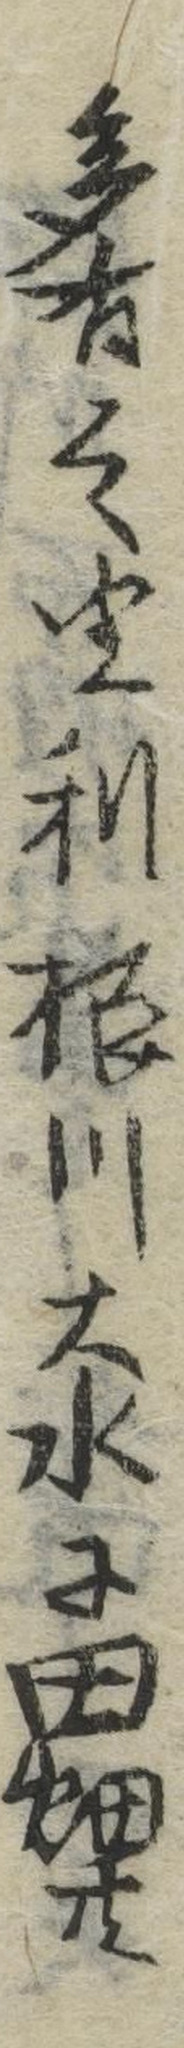多有之由利根川大水に田畑共
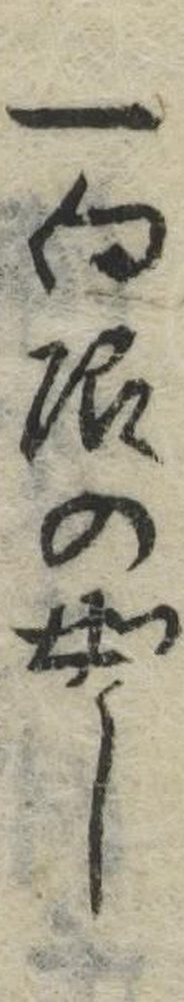一向沼の如し
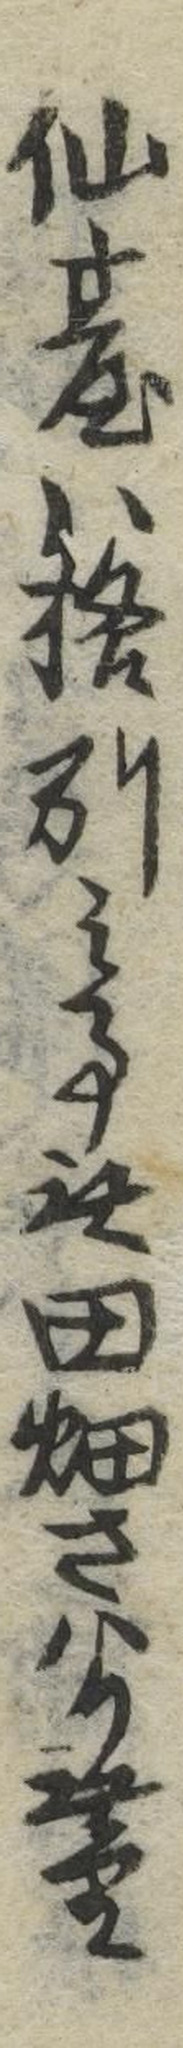仙台ハ格別之事無田畑さハり無由

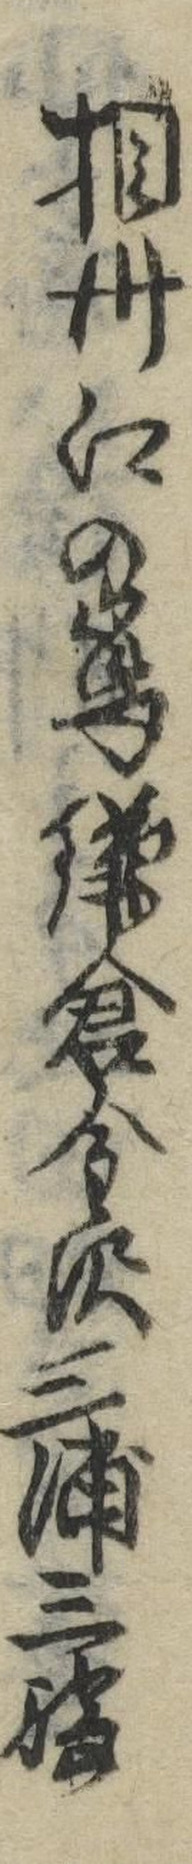相州江の島鎌倉金沢三浦三嶋
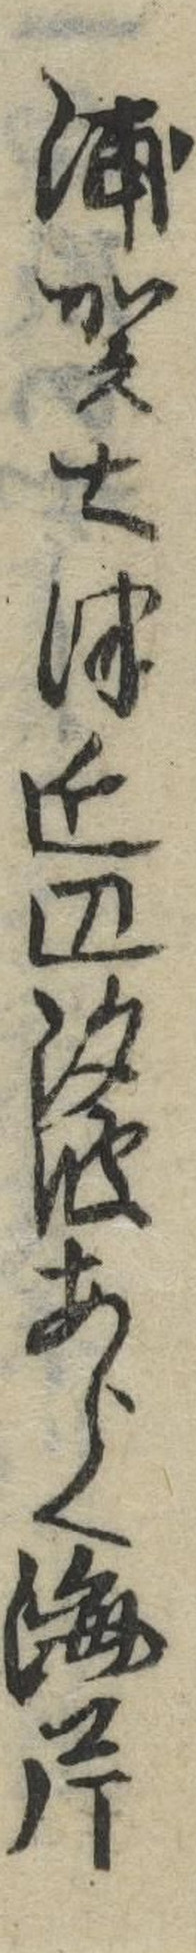浦賀大津近辺汐波あらく海岸
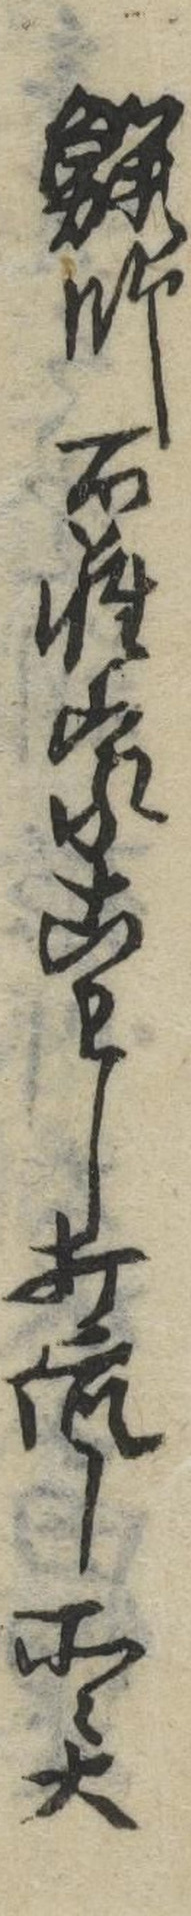漁師百性家こわし打流し所〻大
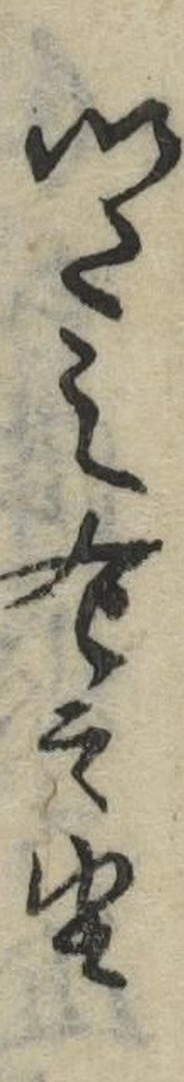いたミ有之由
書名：安政三年辰八月廿五日夜　大江都御屋敷方寺社市中共　大嵐水入場所明細書之寫　并街道筋近郷聞書
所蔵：東京大学地震研究所図書室 Earthquake Research Institute Library, The University of Tokyo, JAPAN
